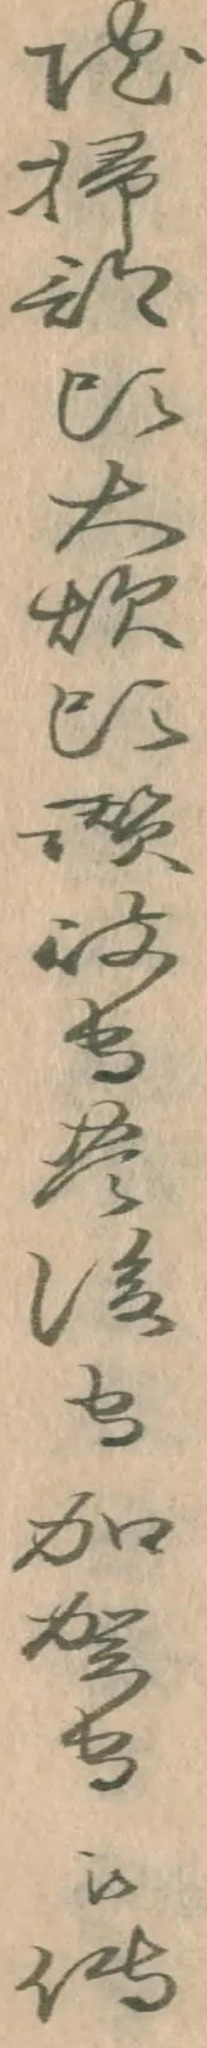随掃部頭大炊頭讃岐守豊後守加賀守被出
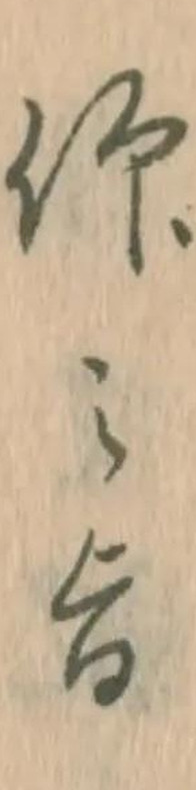仰之旨
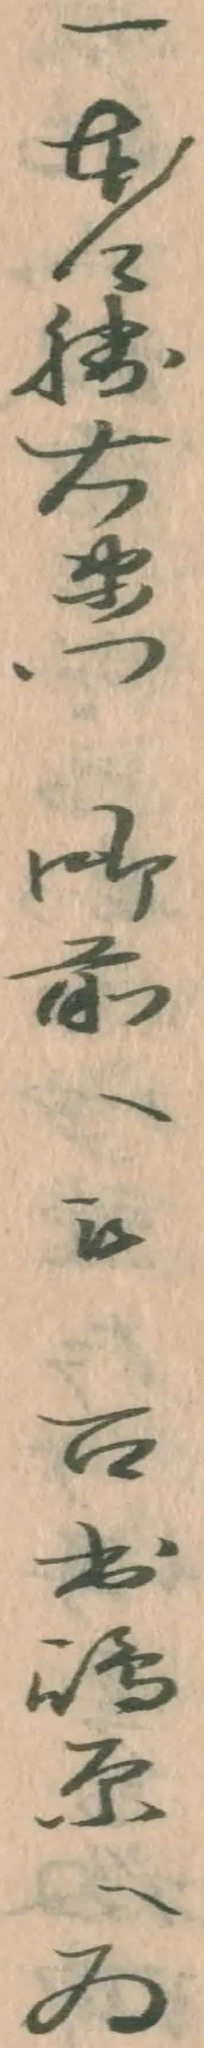一本郷勝右衛門所前へ被召出島原へゐ
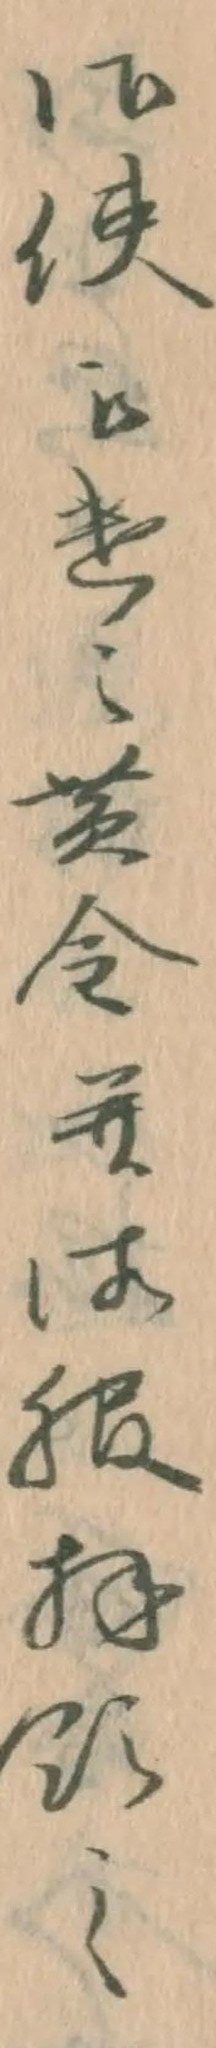御使被遣之貰令幷御服拝領也
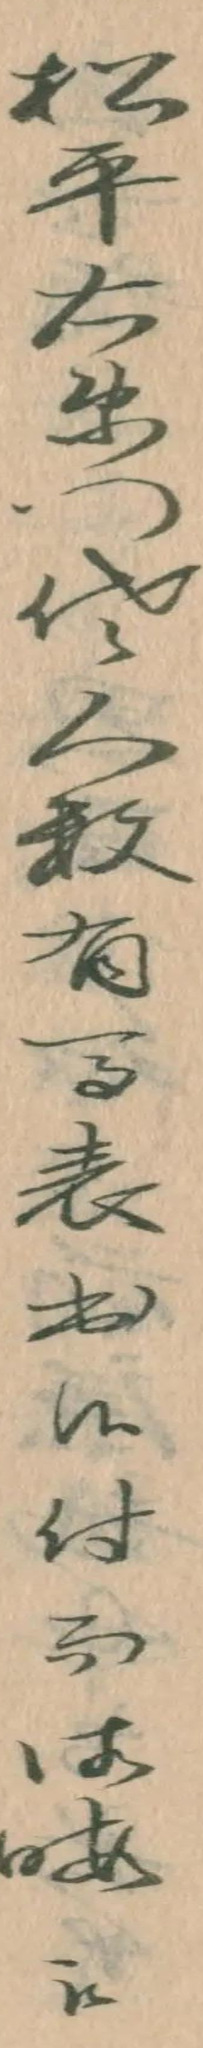一松平右衛門佐人数有馬表出候付而御暇被
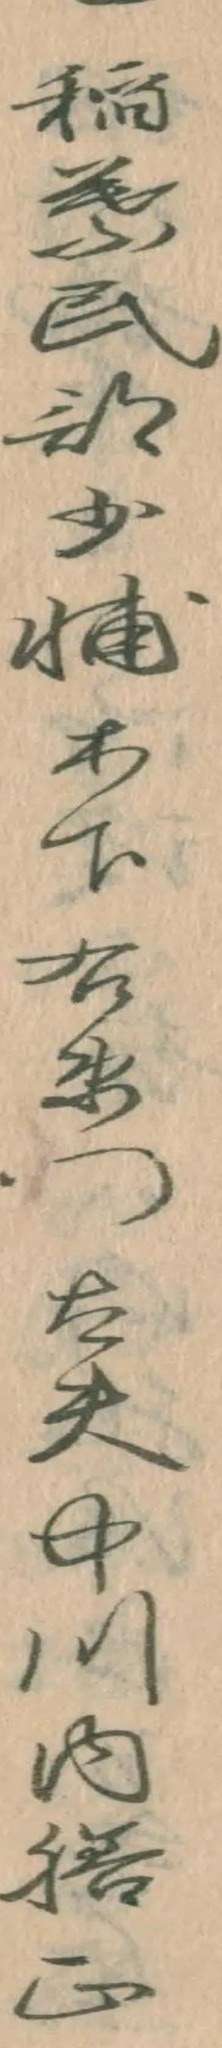一稲葉民部少輔木下右衛門太夫中川内膳正
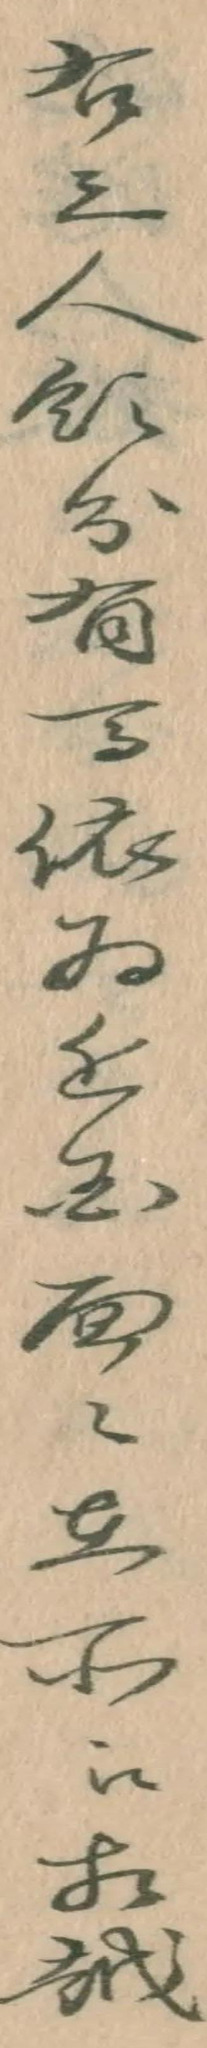右三人領分有馬依ゐ近国面々在所江相越
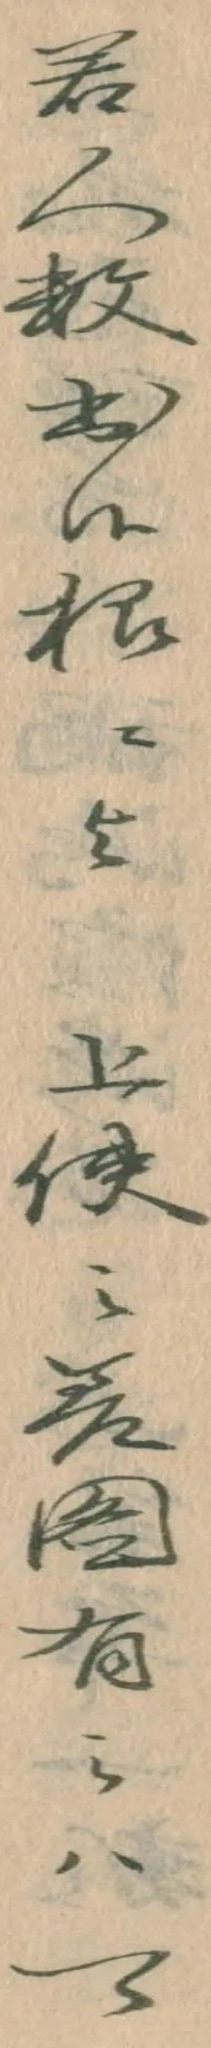若人数出候様に与上使之差図有之は可
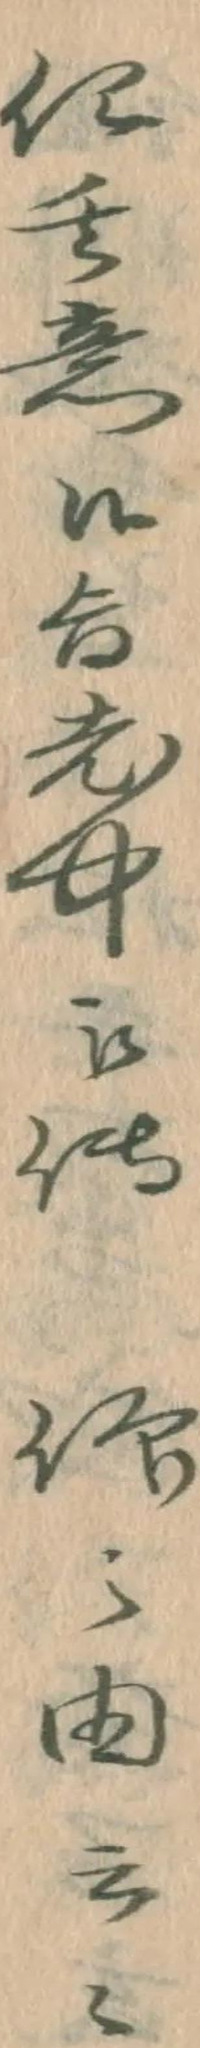任其意候旨老中被伝仰之由云々
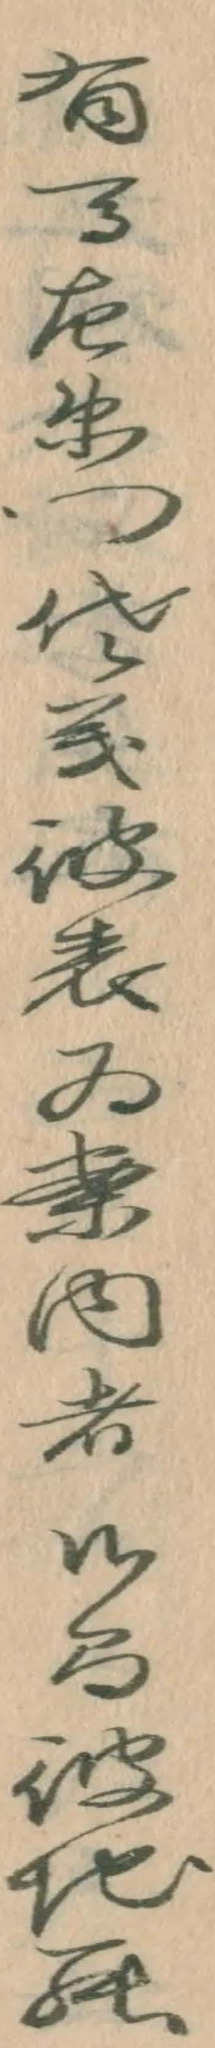一有馬左衛門佐義彼表ゐ案内者候間彼地罷
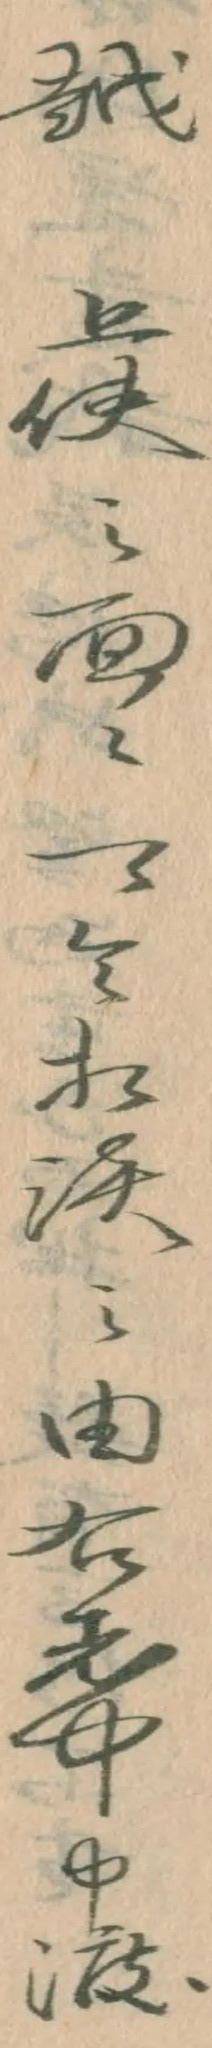越上使之面々可令相談之由右老中申渡

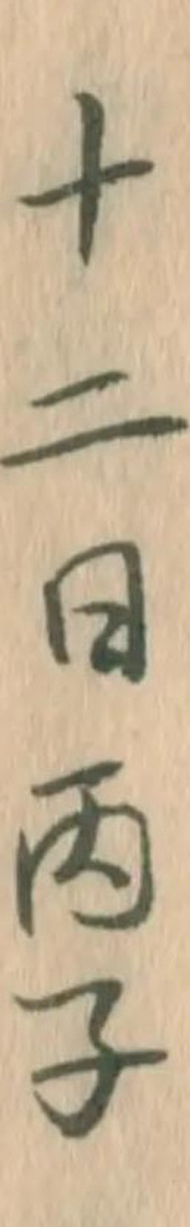十二日丙子
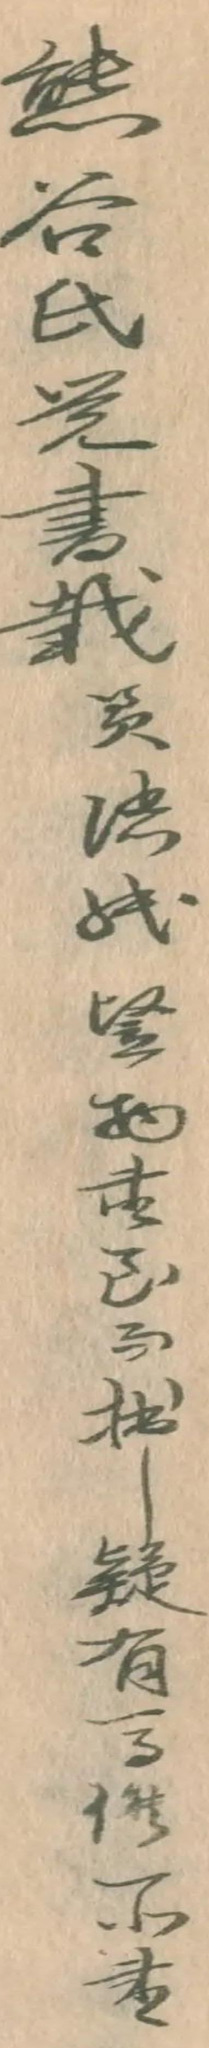熊谷氏覚書載美濃紙堅物書至而拙し疑有馬併所書
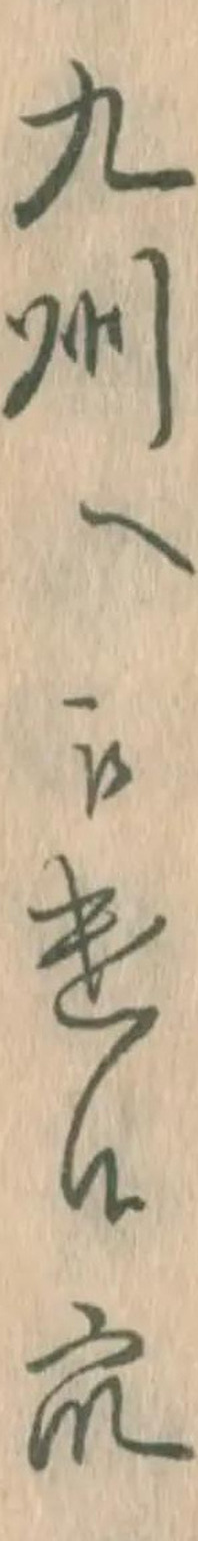九州へ被遣候衆
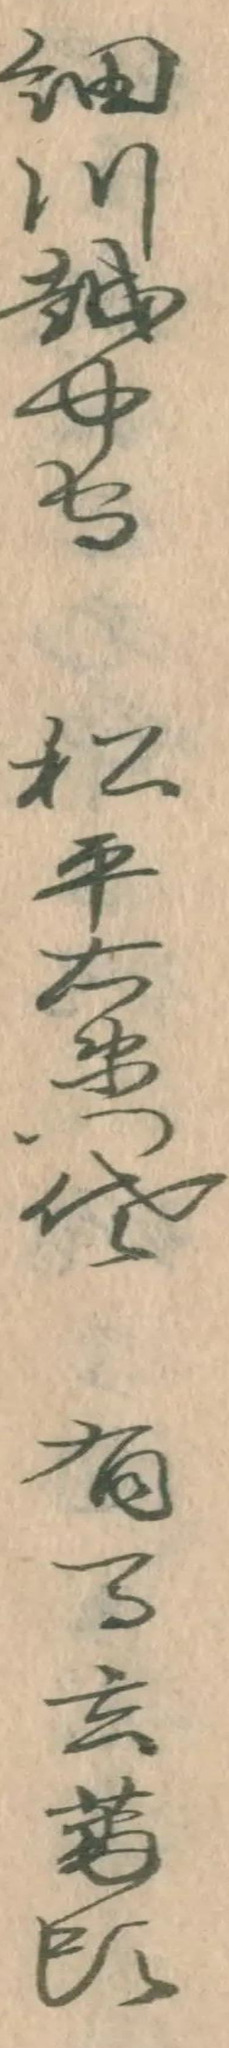細川越中守松平右衛門佐有馬玄蕃頭
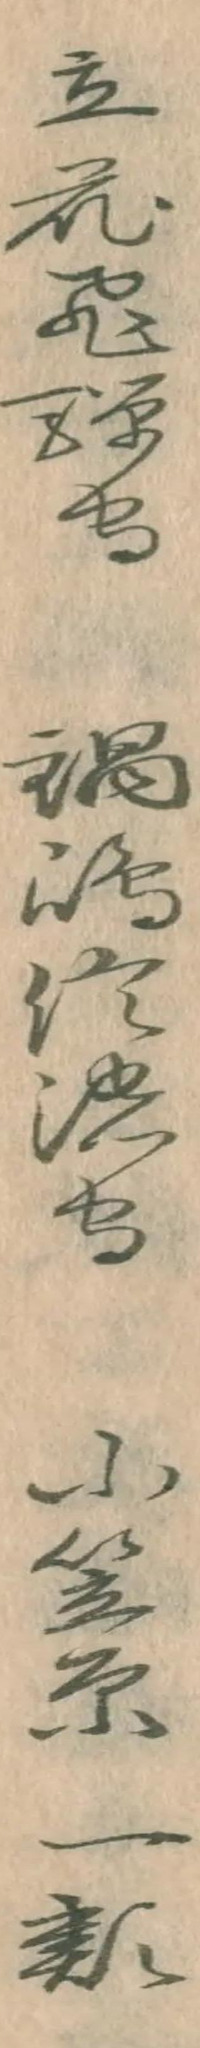立花飛騨守鍋島信濃守小笠原一類
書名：切支丹御退治記 49巻. [6]
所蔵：国立国会図書館 National Diet Library, JAPAN
